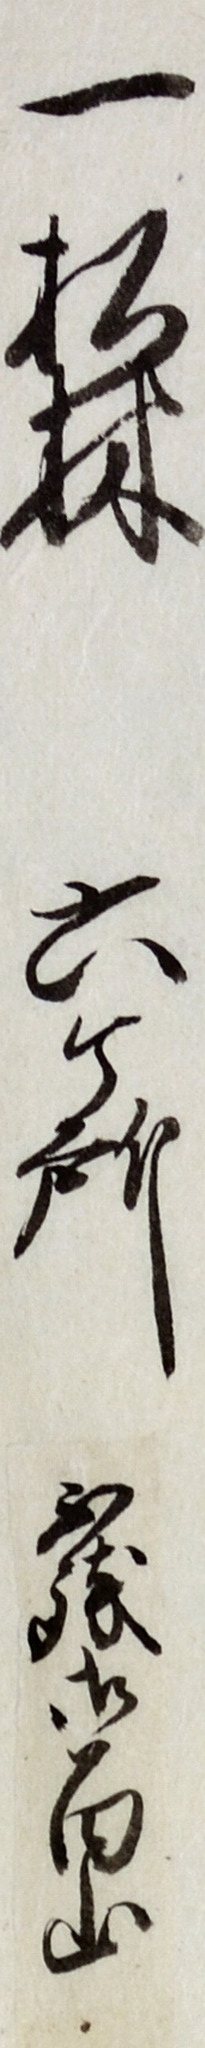一松林六ケ所不残御留山
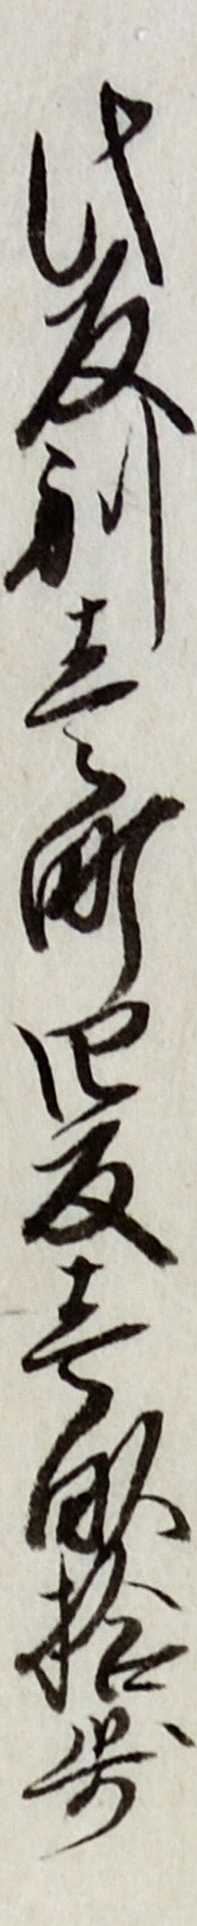此反別壱町四反壱畝拾歩
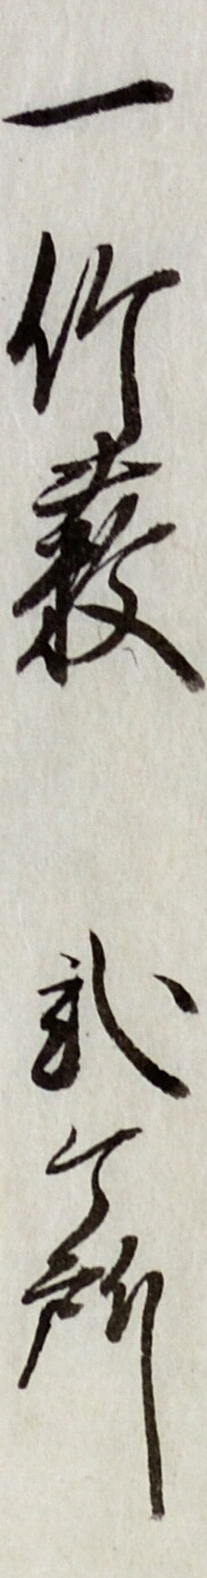一竹藪弐ケ所
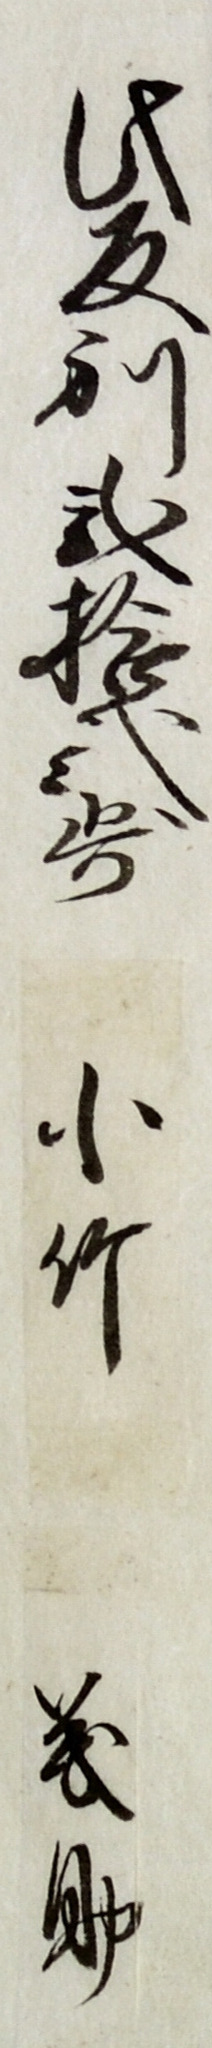此反別弐拾弐歩小竹義助

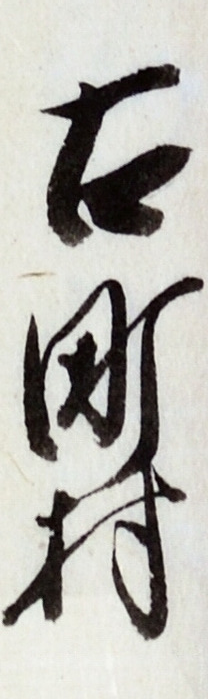古町村
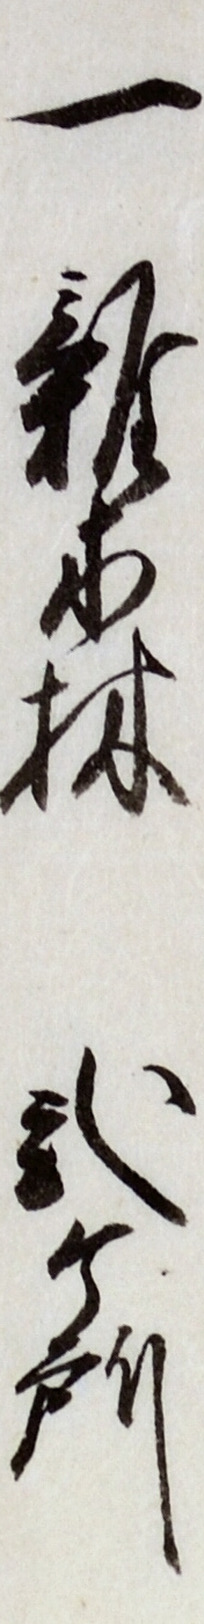一雑木林弐ケ所
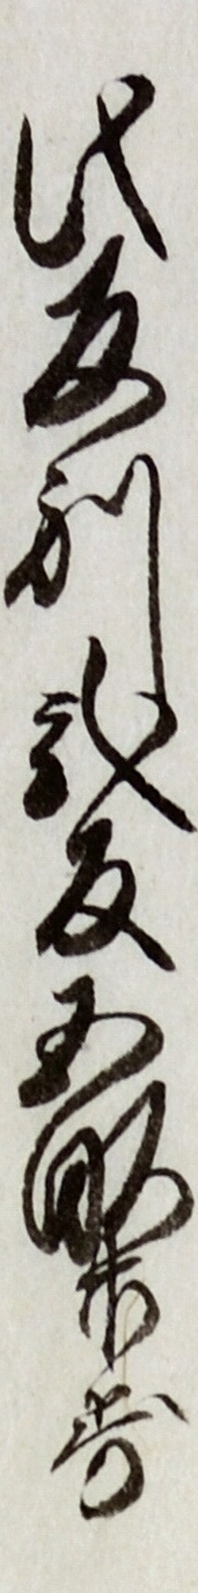此反別弐反五畝廿歩

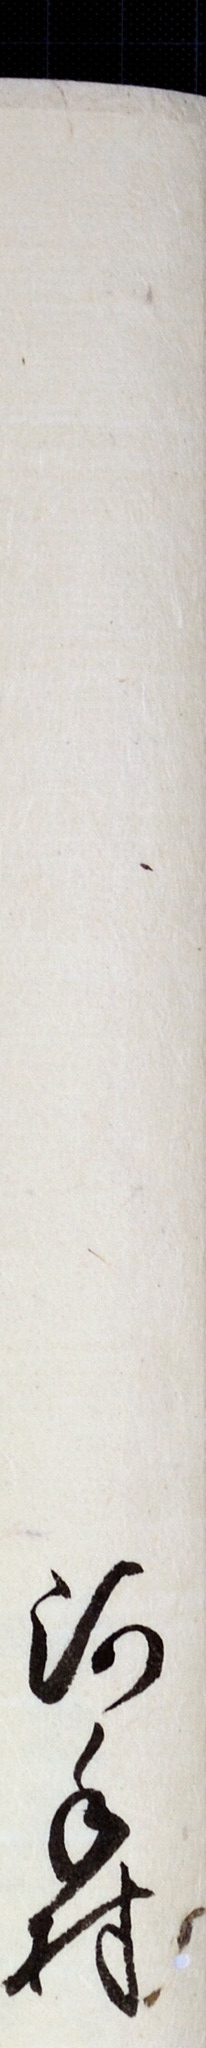河手村
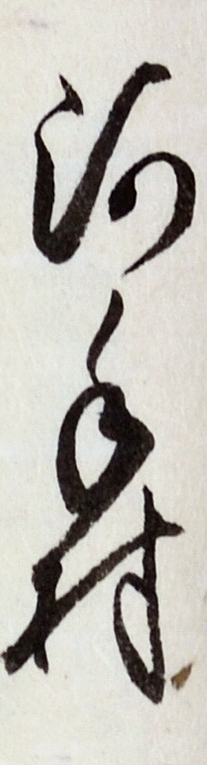河手村
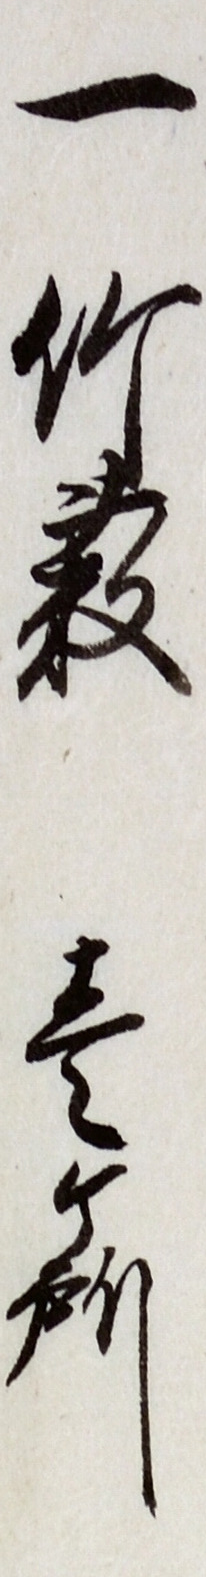一竹藪一ケ所
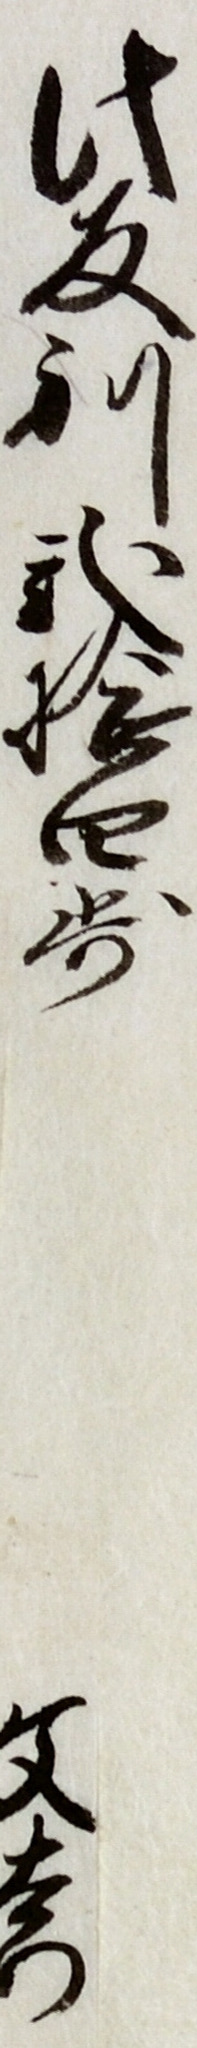此反別弐拾四歩文右衛門

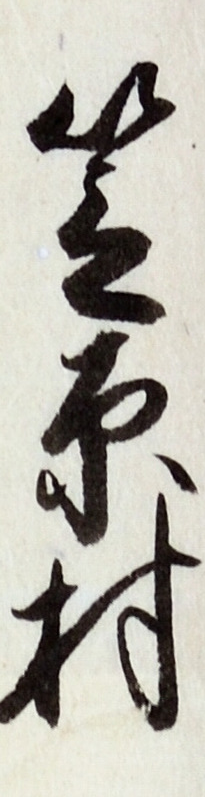笠原村
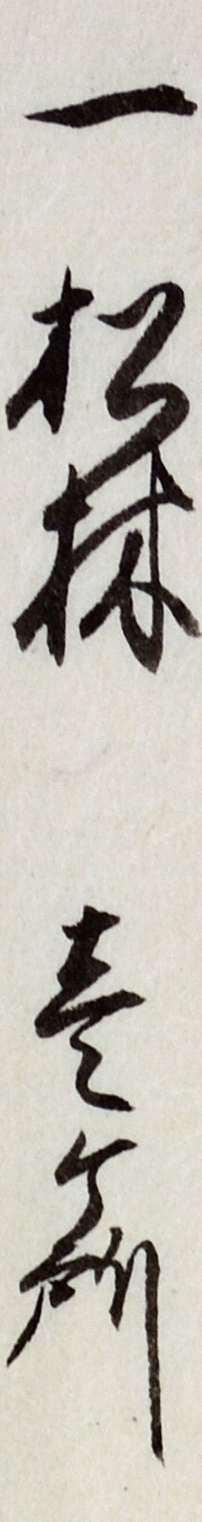一松林壱ケ所
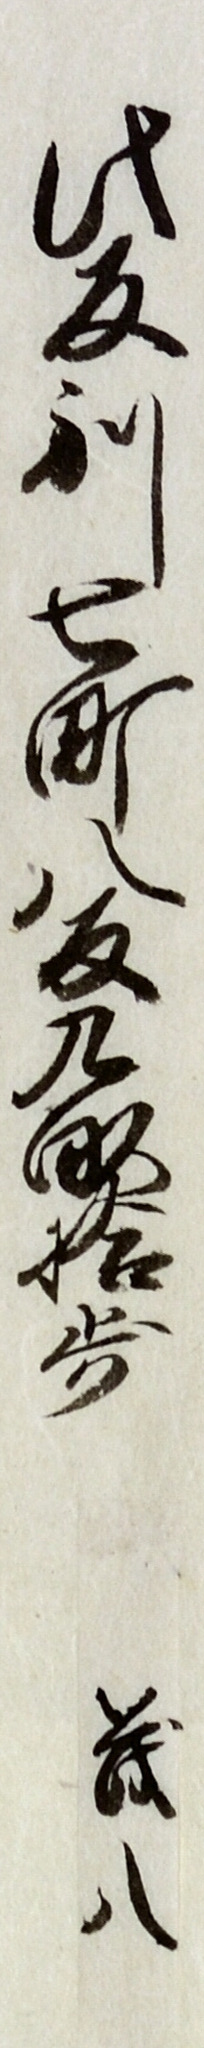此反別七町八反九畝拾歩茂八
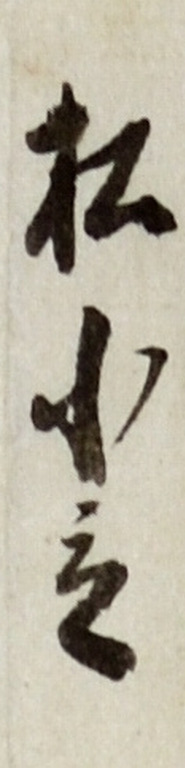松小立

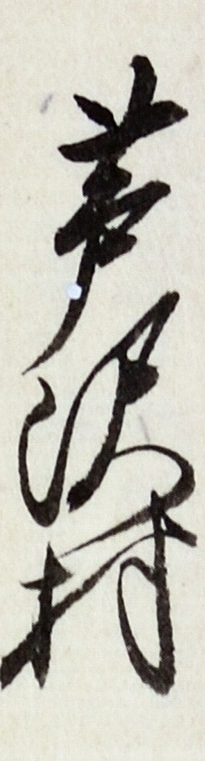芦沢村
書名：御領分中御林御藪附帳
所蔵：伊那市立高遠町図書館・合同会社AMANE
